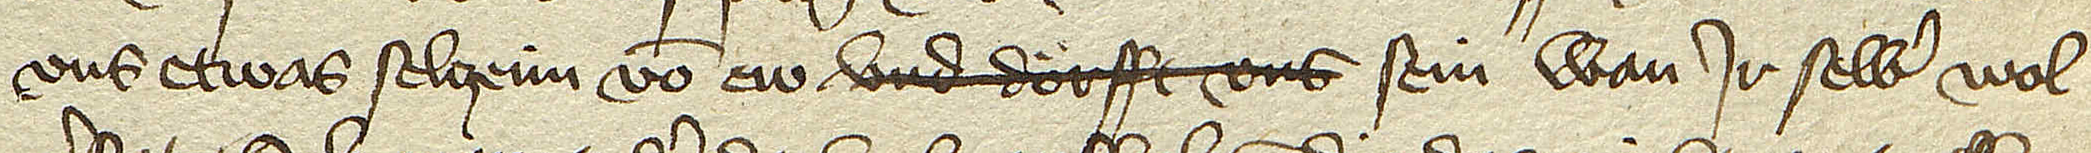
vns etwas ſelcʒeim vo* ew / vnd dörfft vns ſein wan Ir ſelb* wol
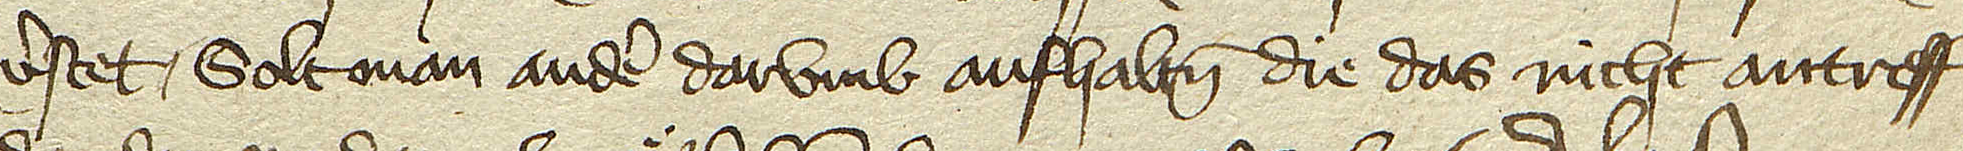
v*ſtet / Solt man and* darvmb aufhaltn* die das nicht antreff
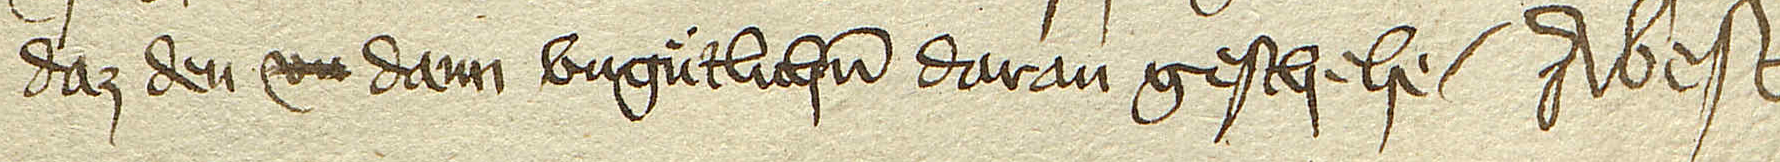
daʒ den vn dann vngütlichn* daran geſchehe / Abeſt
